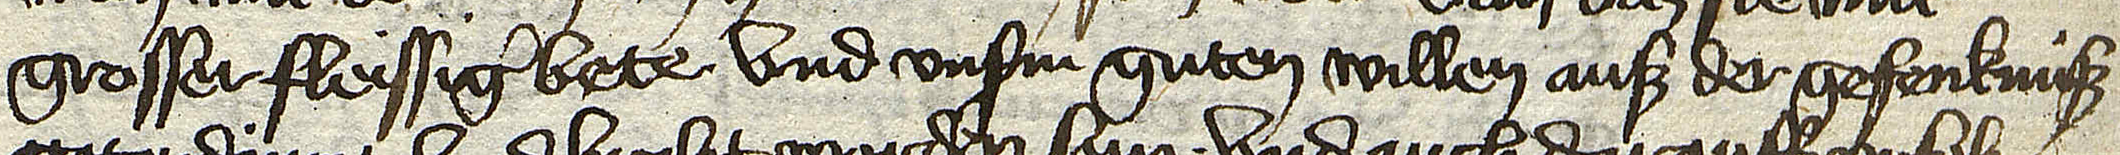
groſſer fleiſſig* bete. Vnd vnſ*m guten willen auſʒ der gefenknüſʒ
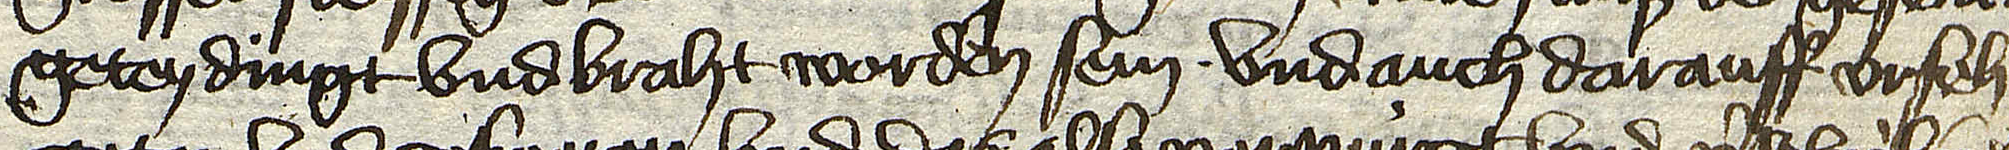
geteydingt vnd braht worden ſein . Vnd auch darauff vrfeh
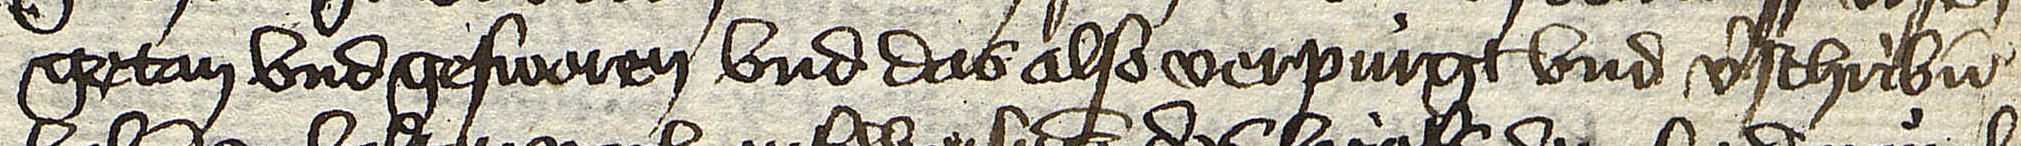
getan vnd geſworen vnd das alſo verpürgt vnd v*ſchrib*n
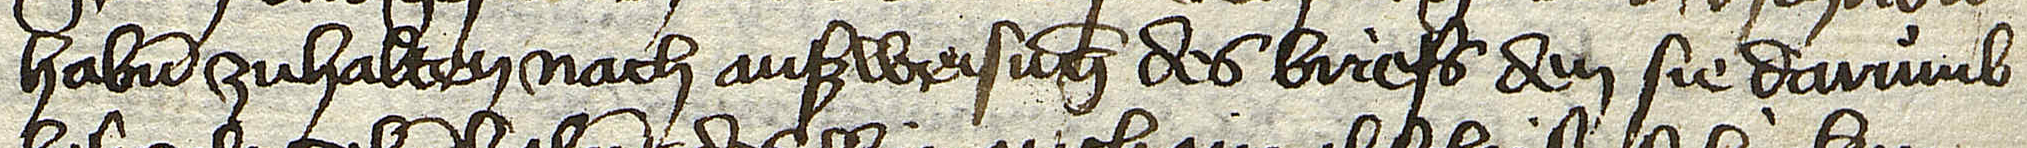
hab*n cʒuhalten nach auſʒweiſu*g des briefs den ſie darümb
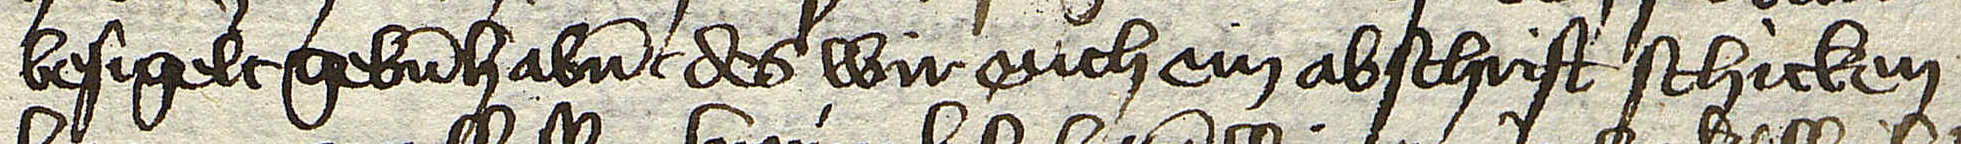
beſigelt gebn* hab*n / des wir euch ein abſchrift ſchicken
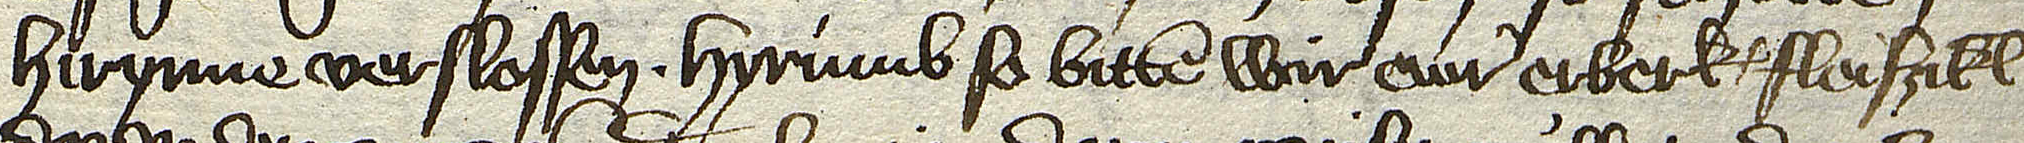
hirynne verſloſſen . hyrümb ſo bitte* wir ewr* erberk* fleiſʒikl*
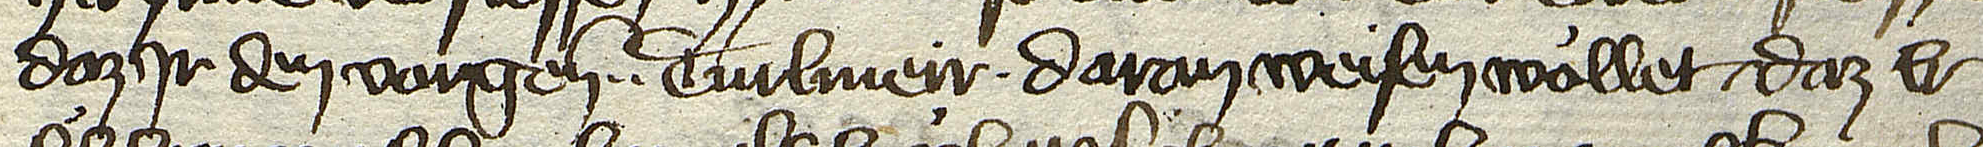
daʒ Ir den vorgen* . Turlmeir . daran wöllet / daʒ Er
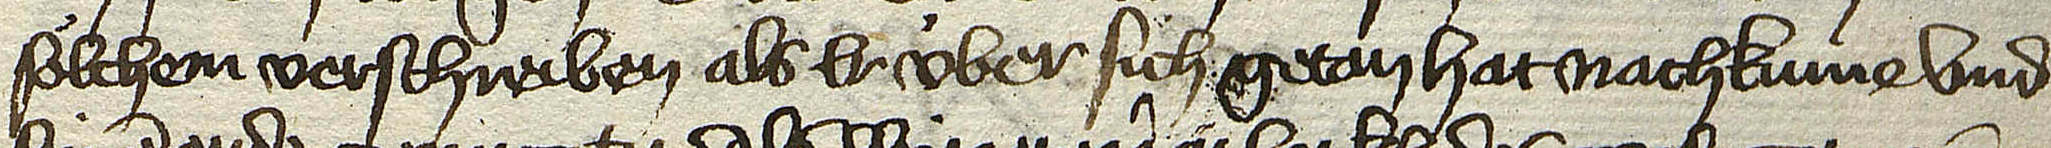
ſölchem verſchriben als Er v̈ber ſich getan hat nachkume Vnd
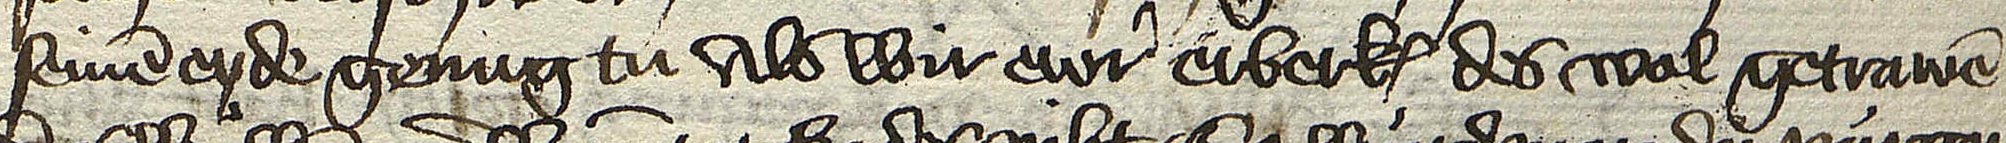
ſeine* eyde genug tu Als wir ewr* erberk* des wol getrawe*
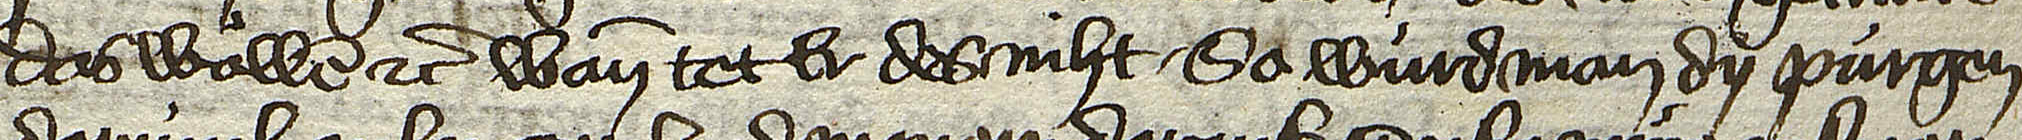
das wölle ec* wan* tet Er des niht / So würd man dy pürgen
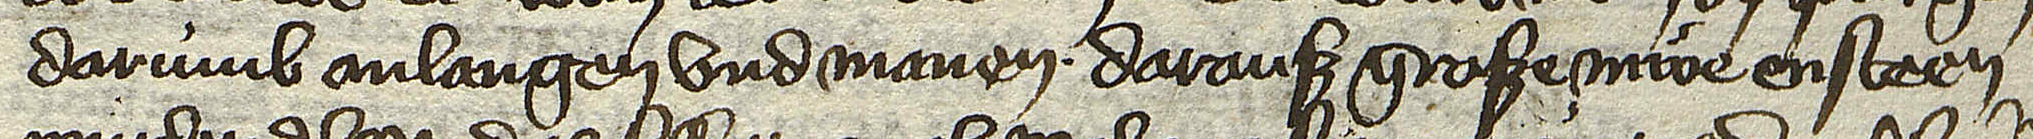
darümb anlangen vnd manen . darauſʒ groſʒe mẅe enſteen
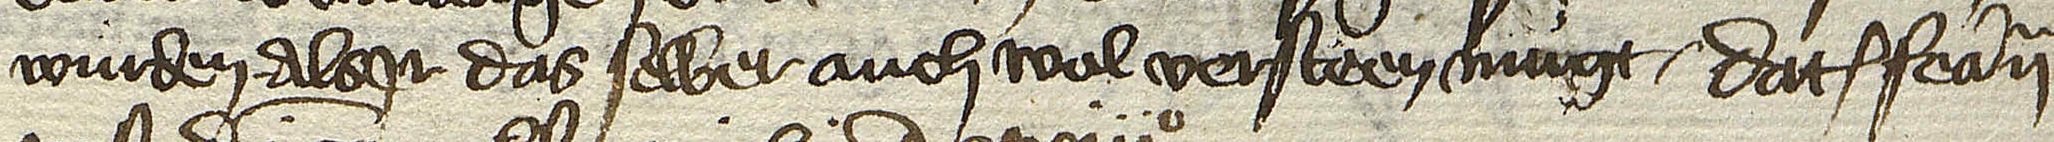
würden Als Ir das ſelber auch wol verſteen mügt / Dat* fe*a ii*
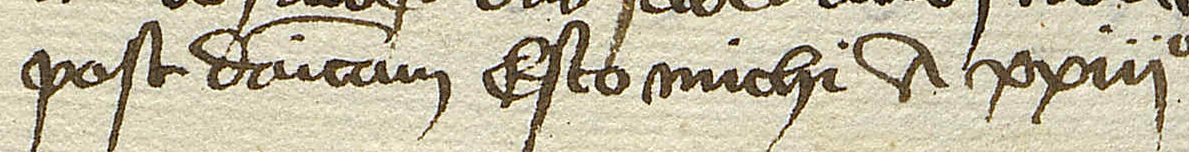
poſt doicam* Eſto michi A xxiii*
